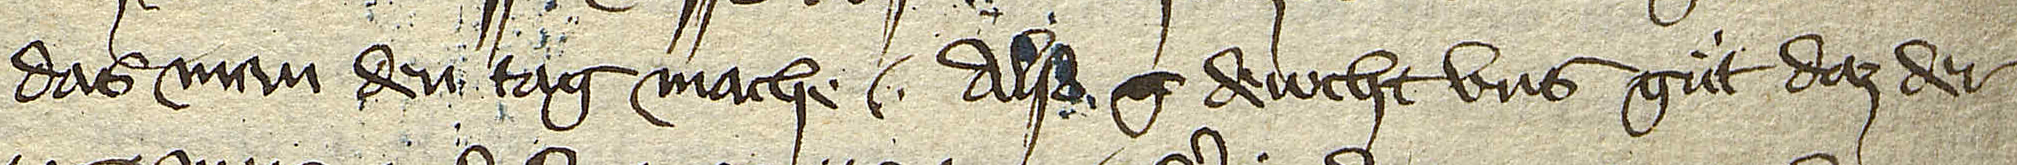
das man den tag mache / . Alſo g dewcht vns güt daʒ der
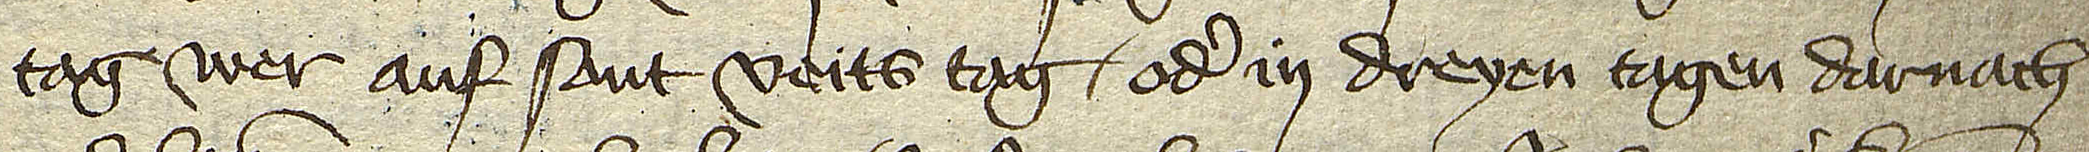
tag wer auf ſant veits tag / od* in dreyen tagen darnach
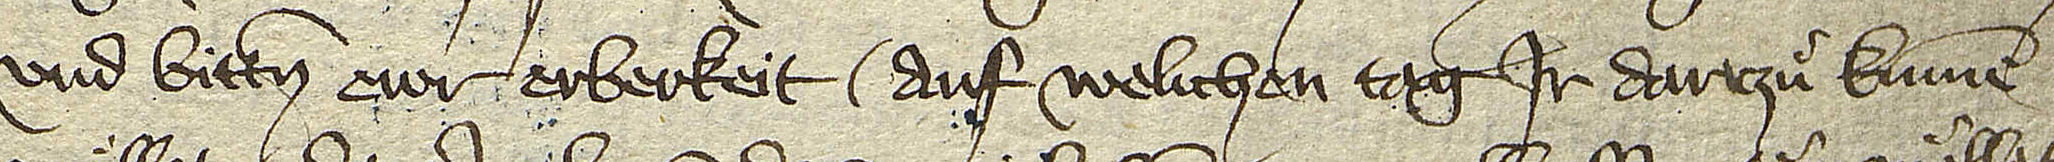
vnd bittn* ewr erberkeit / Auf welichen tag Ir darcʒü kume*
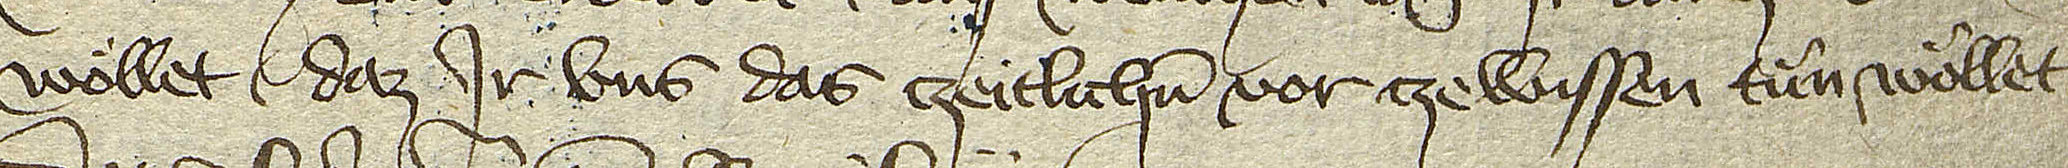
wöllet / daʒ Ir vns das cʒeitlichn* vor cʒewiſſen tün wöllet /
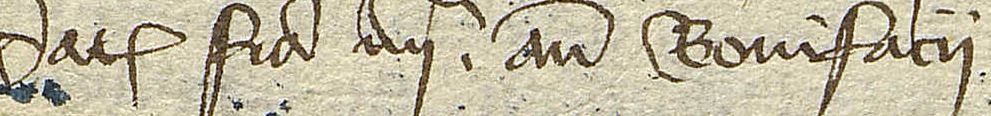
Dat* fia* iiii* . an* Bonifacii / .
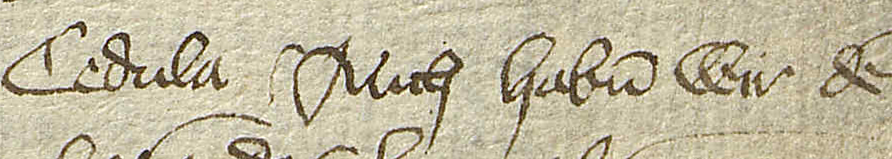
Cedula / Auch habn* wir de*
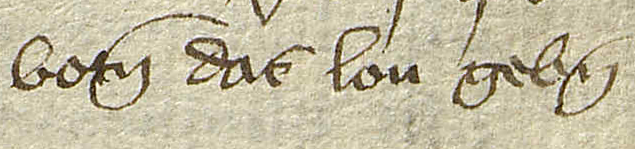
botn* das lon gebn*
